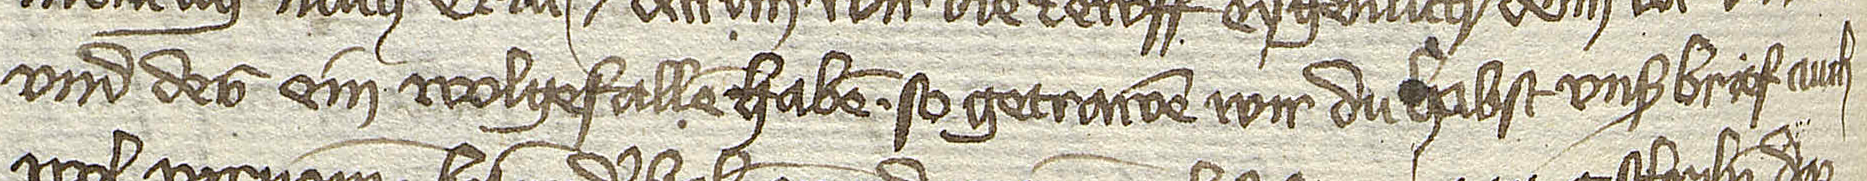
vnd des ein wolfgefalle* habe* . ſo getrawe* wir du habſt vnſ* brief auch
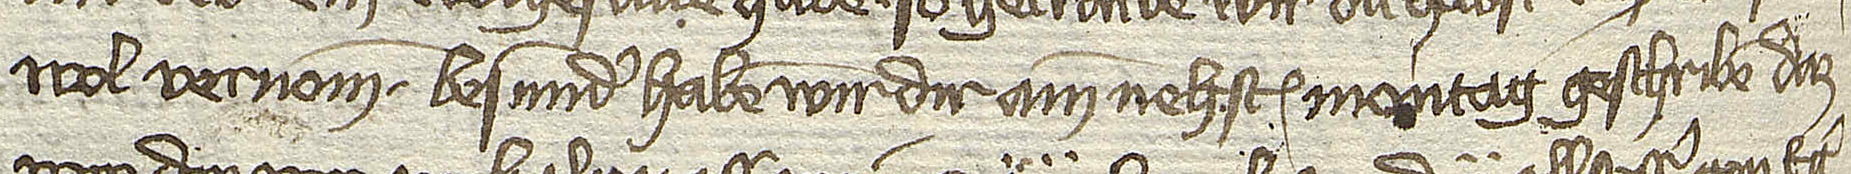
wol vernom* . beſund* habe* wir dir am* nehſt* montag geſchribe* daʒ
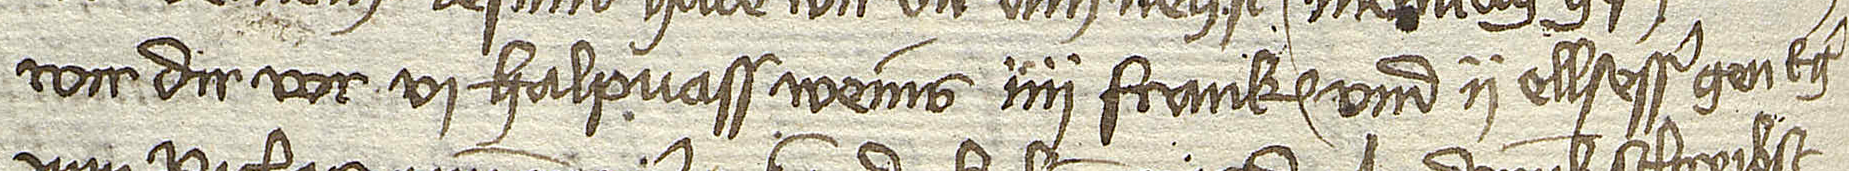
wir dir vor vi halpuaſſ weins iiii frank* vnd ii ellſeſſ* gen Eg*
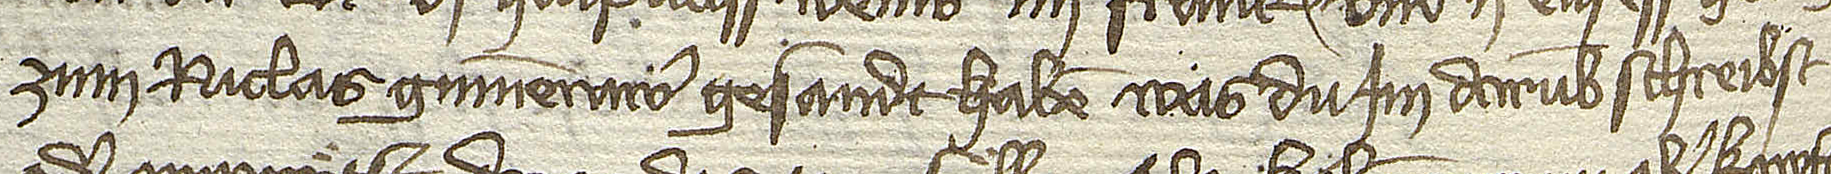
ʒum Niclas gum*eraw* geſandt* habe* was du Im darub* ſchreibſt
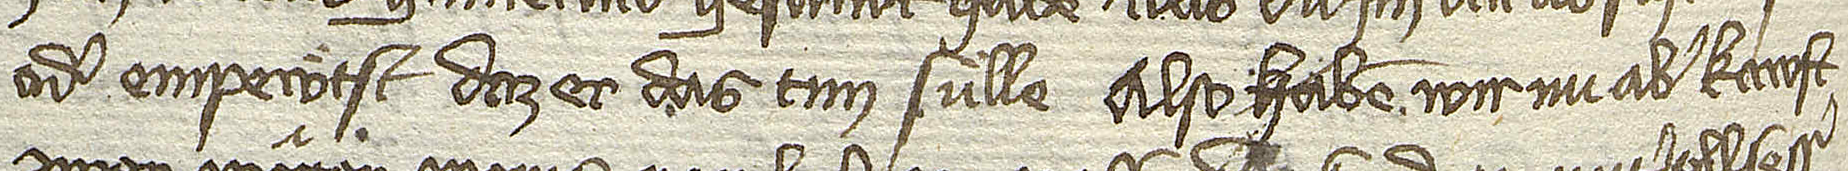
od* empewtſt daʒ er das tun ſülle Alſo habe* wir nu ab* kawft
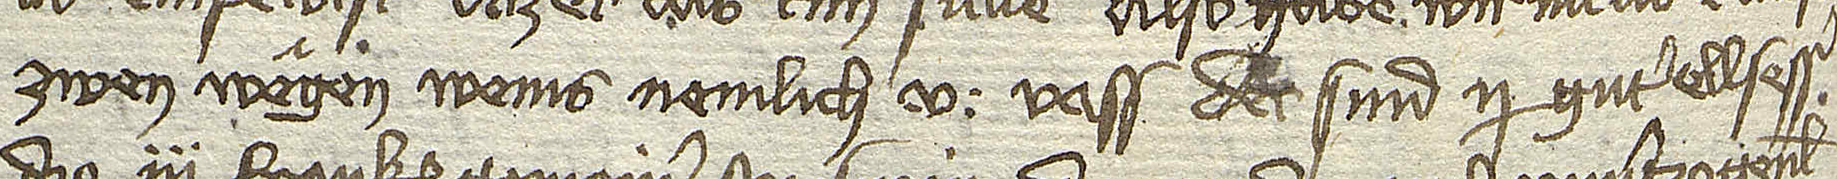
ʒwen wëgen weins nemlich . v : vaſſ der ſind ii gut* ellſeſſ*
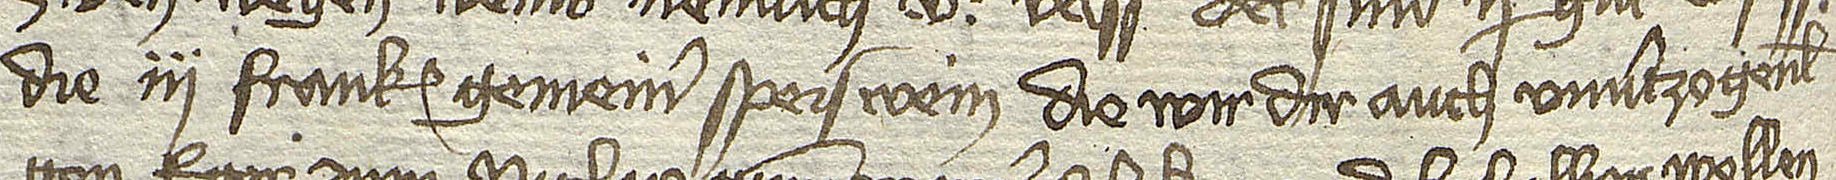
die iii frank* gemein* ſpeiſwein die wir dir auch vnu*cʒogenl*
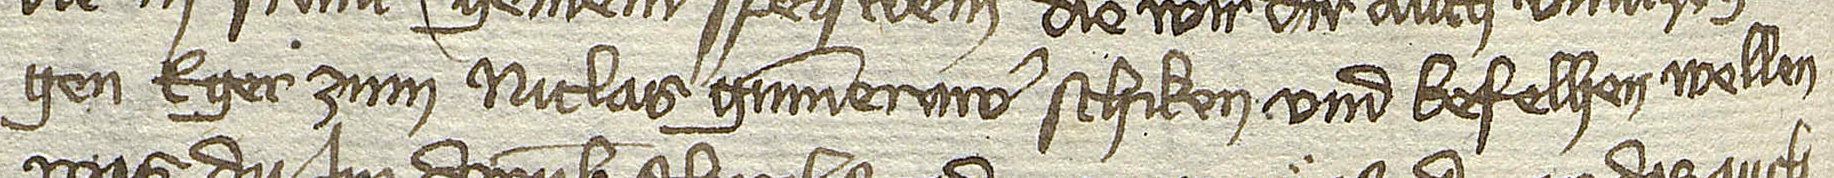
gen Eger ʒum Niclas gum*eraw* ſchiken vnd befelhen wellen
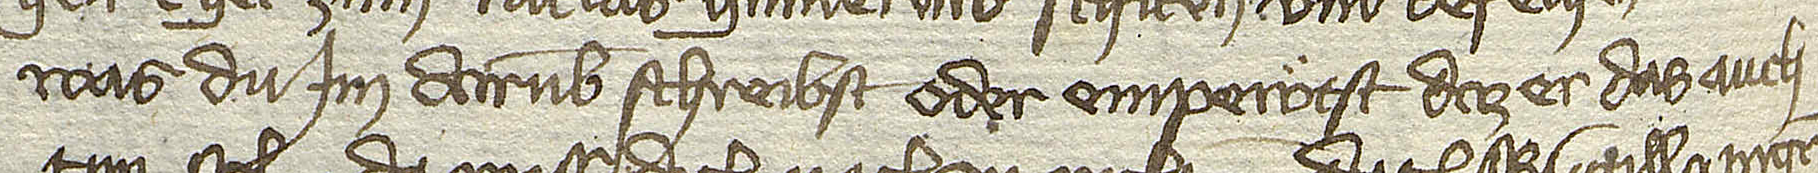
was du Im darub* ſchreibſt oder empewtſt daʒ er das auch
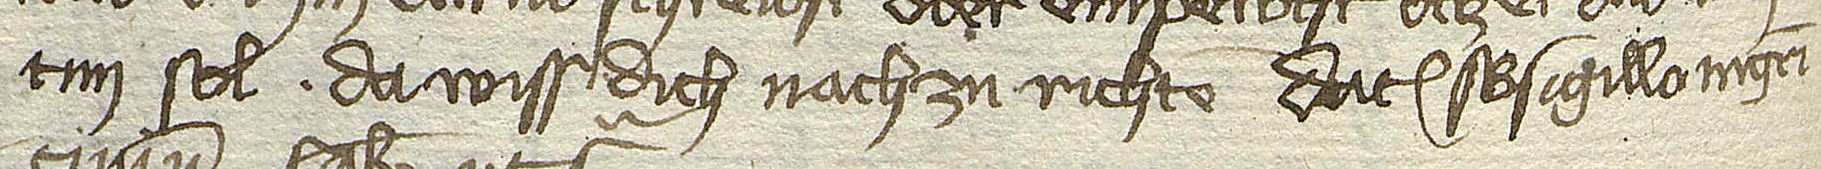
tun ſol . da wiſſ dich nach ʒu richte* dat* ſB* ſigillo mgri*
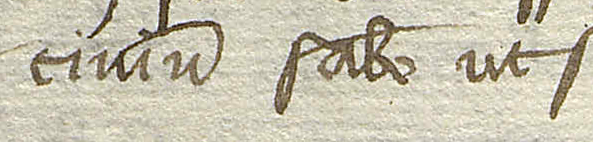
ciuiu* ſabo* ut ſ*
